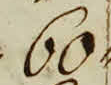60
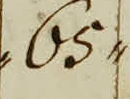65
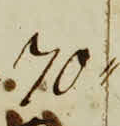70
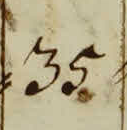35
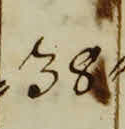38
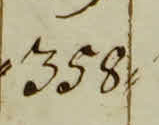358
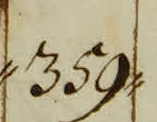359
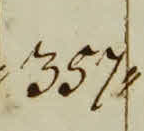357
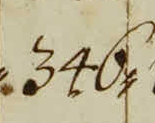346
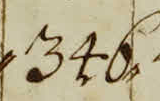346
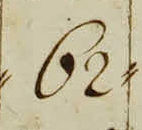62
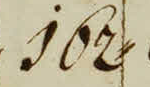162
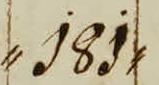181
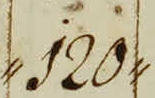120
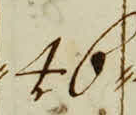46
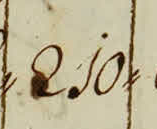210
